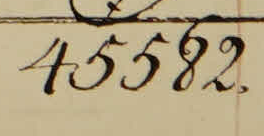45582
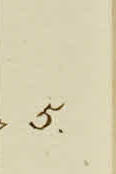5.
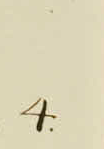4.
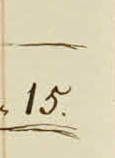15.
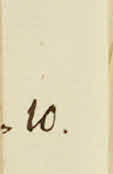10.
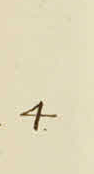4.
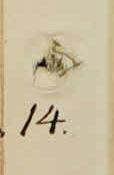14.
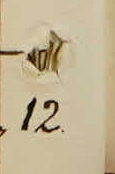12.
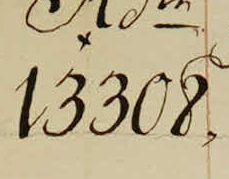13308
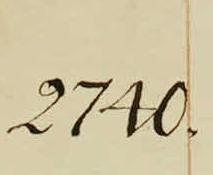2740
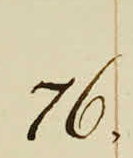76
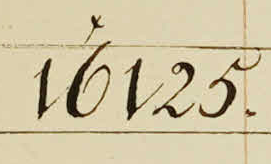16125
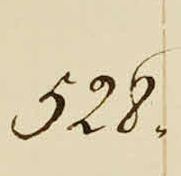528
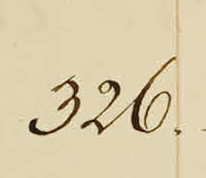326
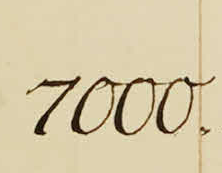7000
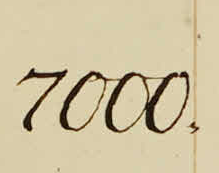7000
